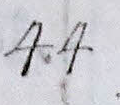44
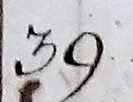39
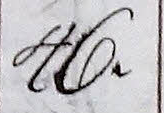46.
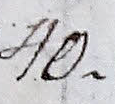40
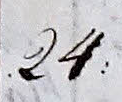24
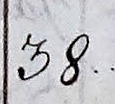38
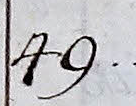49
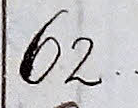62
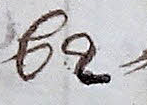62
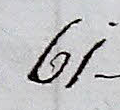61
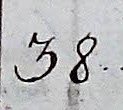38
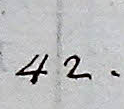42
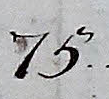75
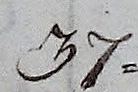37
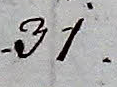31
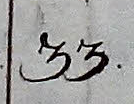33
